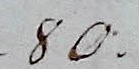80
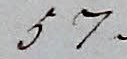57
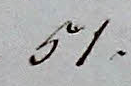51
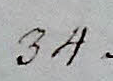34
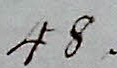48
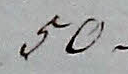50
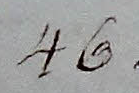46
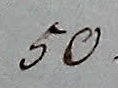50
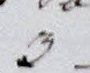3
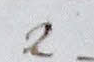2
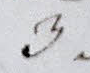3
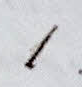1
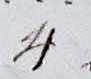4
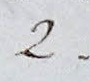2
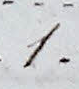1
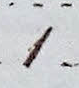1
